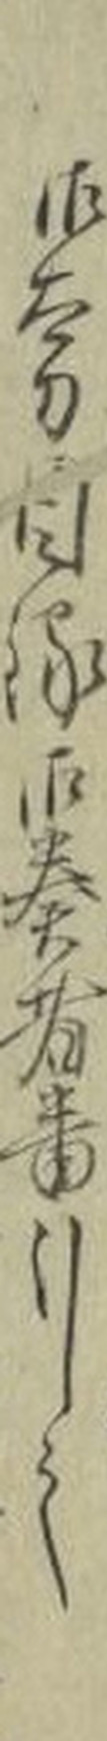御太刀目録御奏者番引之
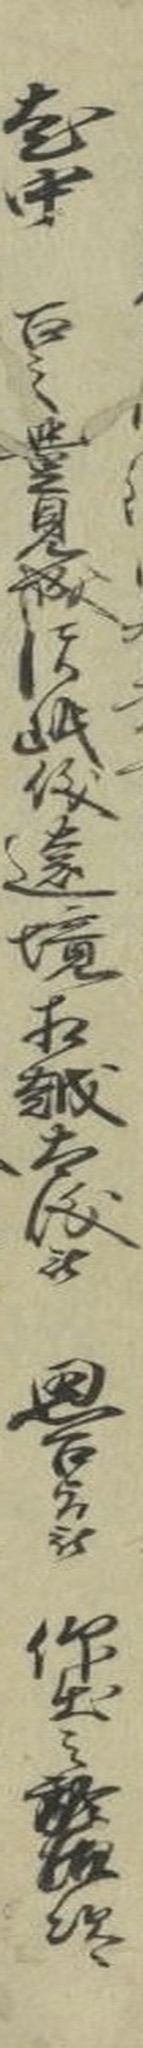一老中召之豊見城沢岻儀遠境相越太儀被思召旨被仰出之次に
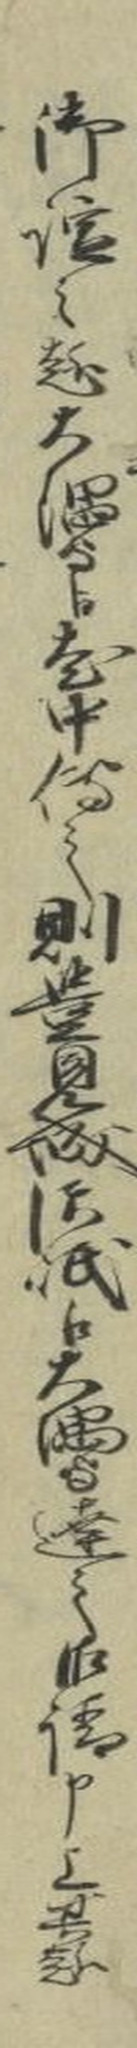御諚之趣大隅守え老中伝之則豊見城沢岻え大隅守達之御請申上其趣
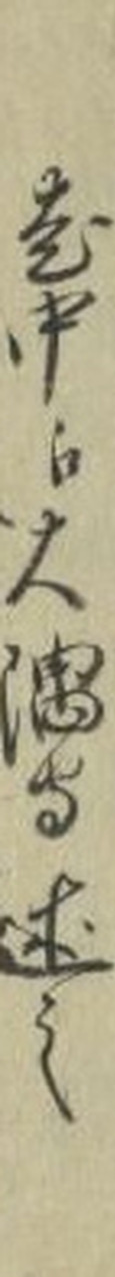老中え大隅守述之
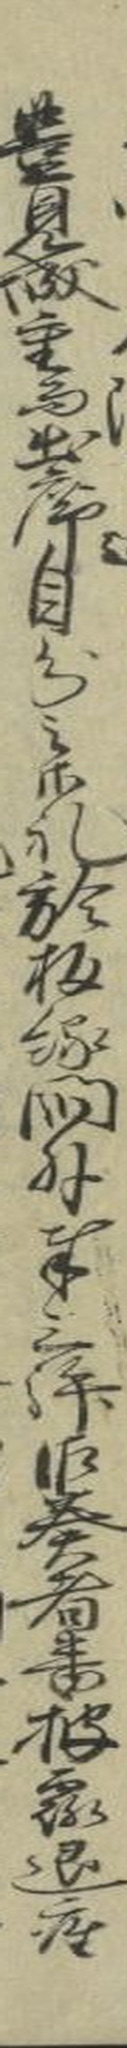一豊見城重て出席自分之御礼於板縁閾外奉三拝御奏者番披露退座
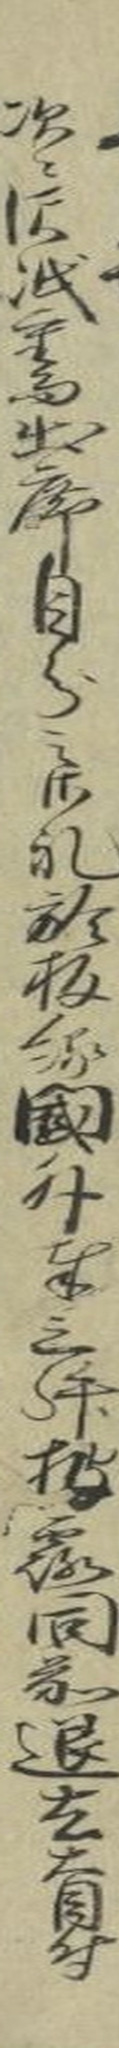次に沢岻重て出席自分之御礼於板縁閾外奉三拝披露同前退去大目付
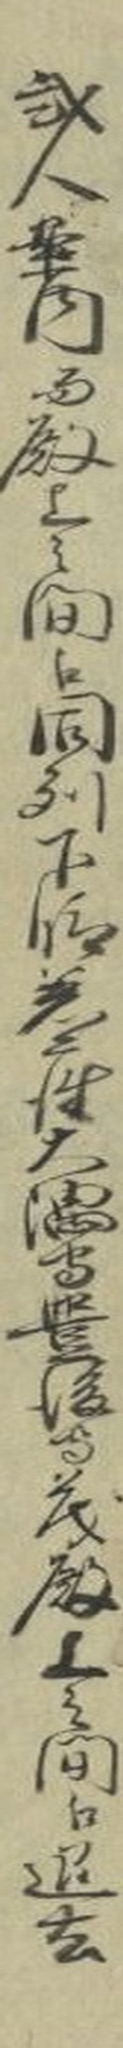弐人案内而殿上之間え同列下段着座大隅守豊後守も殿上之間え退去
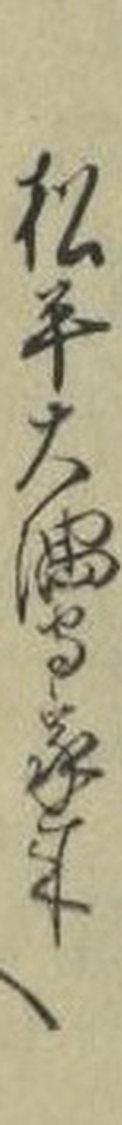松平大隅守家来
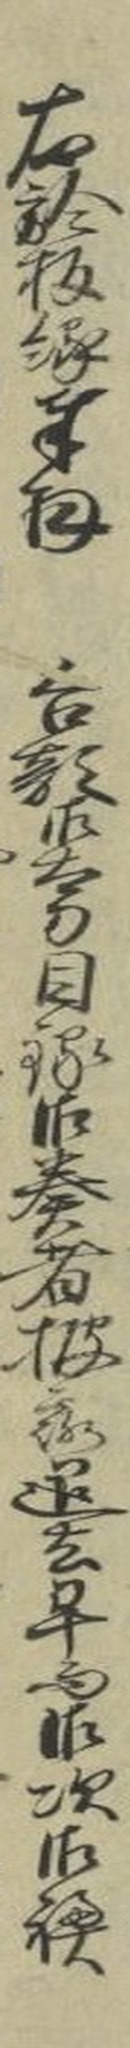右於板縁奉拝台彰御太刀目録御奏者披露退去畢て御次御襖
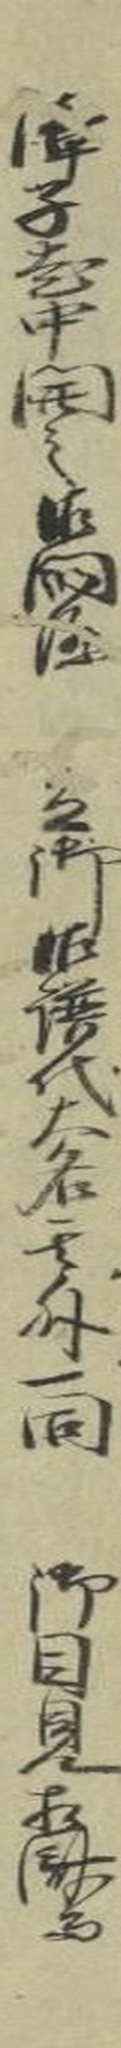障子老中開之御閾際立御御譜代大名其外一同御目見相済て
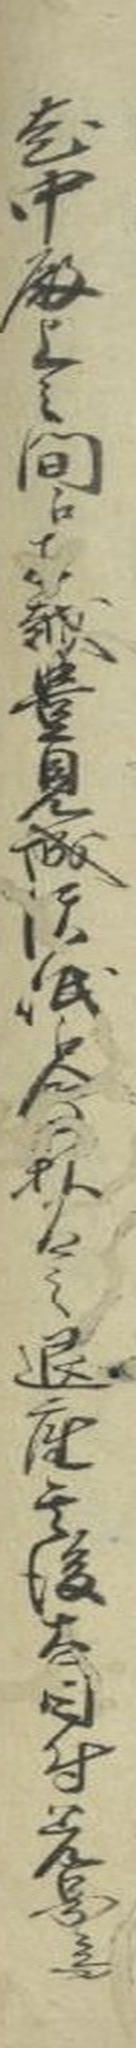老中殿上之間え相越豊見城沢岻え会釈有之退座其後大目付差図にて
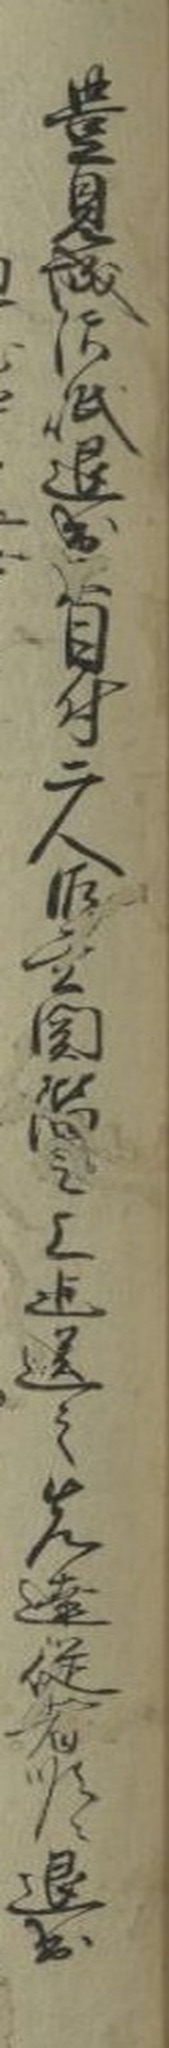豊見城沢岻退出大目付二人御玄関階之上迄送之先達従者順々退出
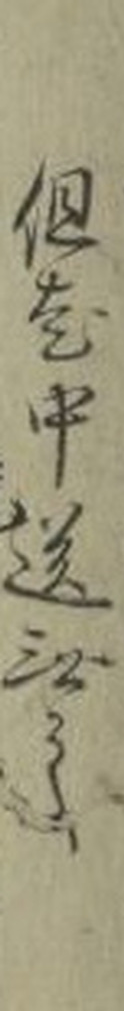但老中送無之
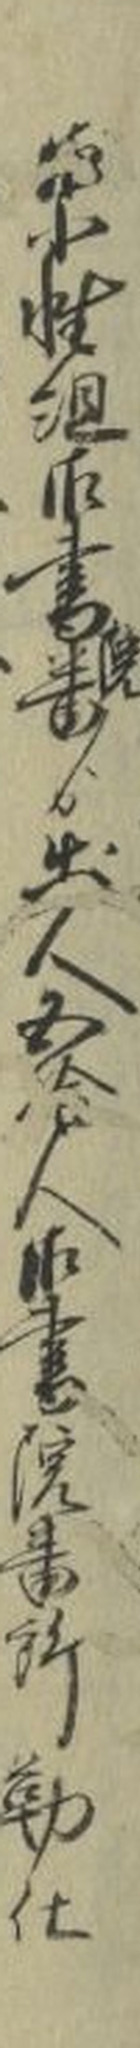一御小性組御書院番ゟ出人五拾人御書院番所勤仕
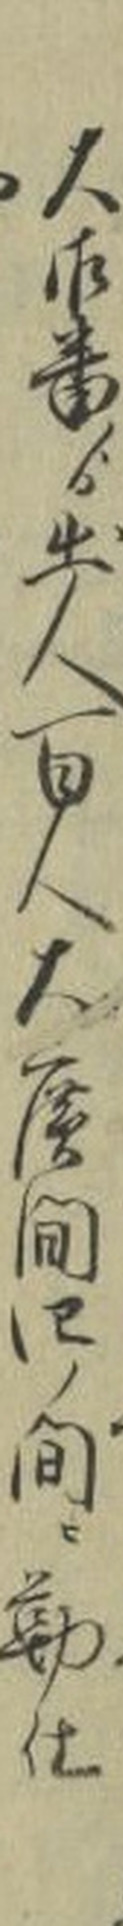一大御番ゟ出人百人大広間四の間に勤仕
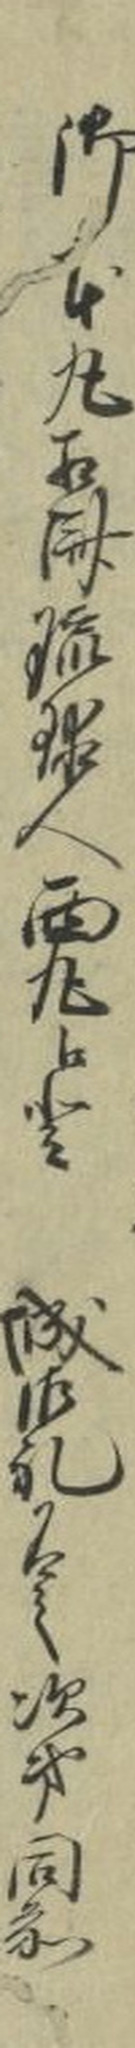一御本丸相済琉球人西丸え登城御礼有之次第同前
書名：天保三壬辰年琉球人参府之節勤方書留
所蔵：University of the Ryukyus Library
